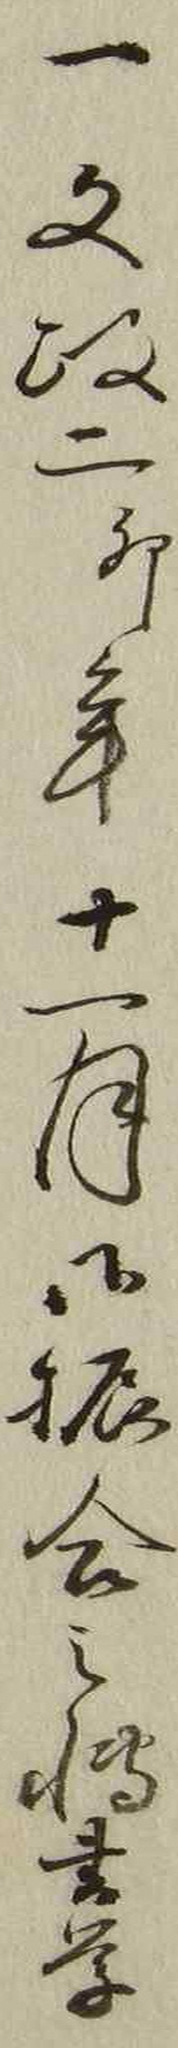一文政二卯年十一月御振合之転書学
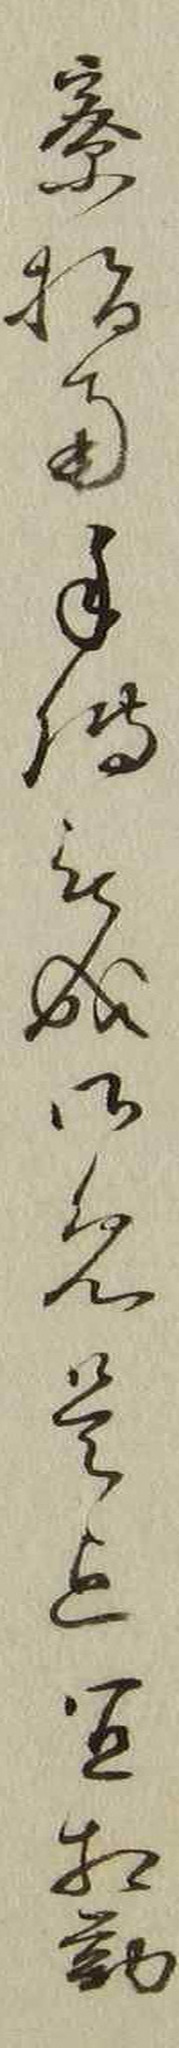寮指南手伝被成御免是迄宜相勤
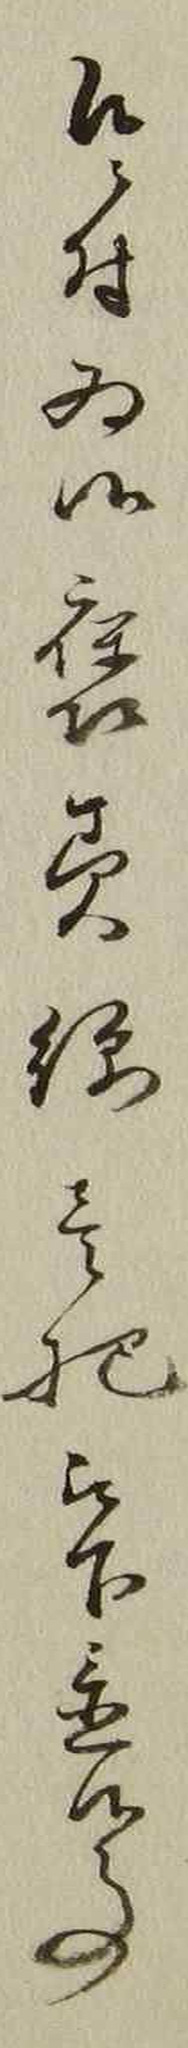候ニ付為御褒美綿壱把被下置候事
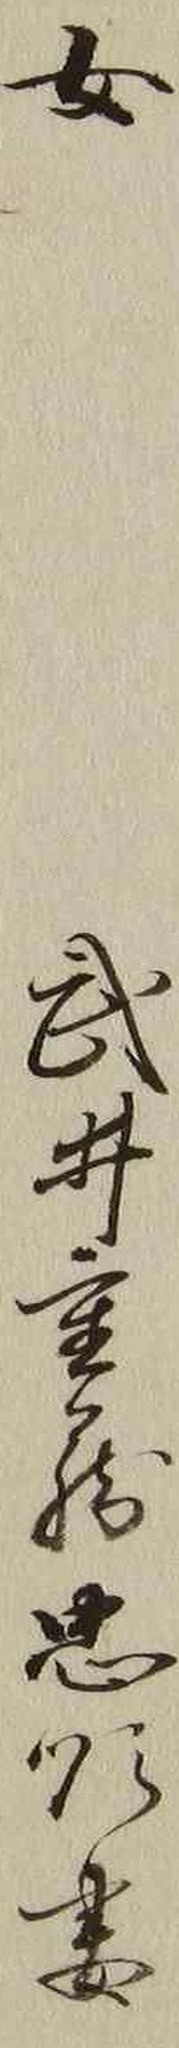女武井重蔵忠順妻
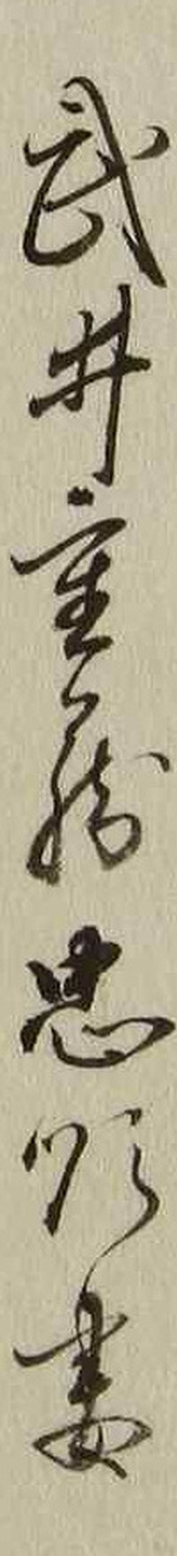女武井重蔵忠順妻
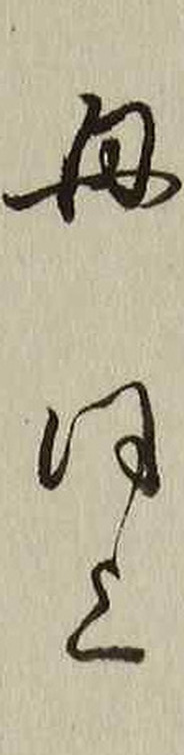母同上
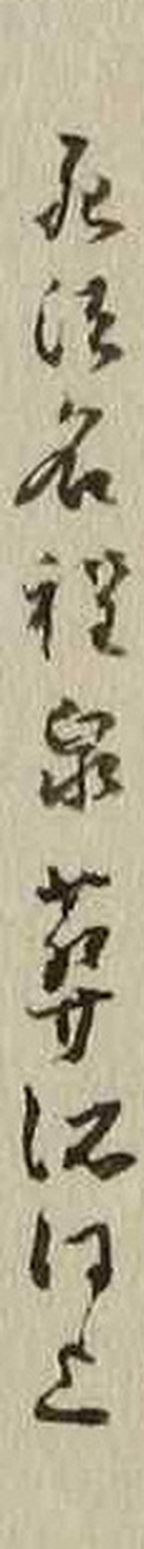死法名程泉葬所同上
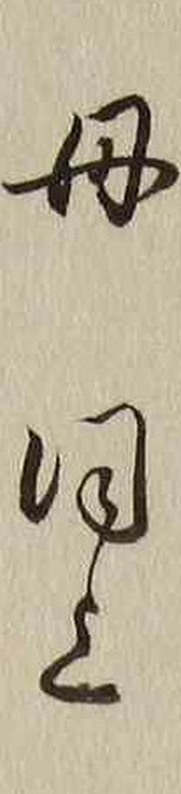母同上
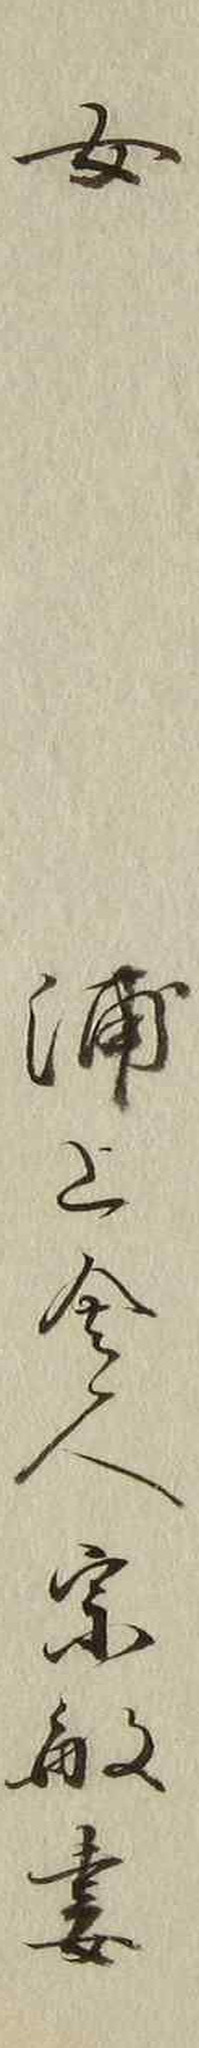女浦上舎人宗敏妻
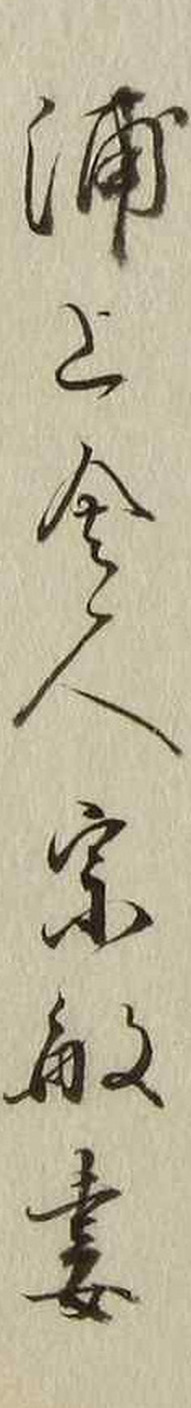女浦上舎人宗敏妻
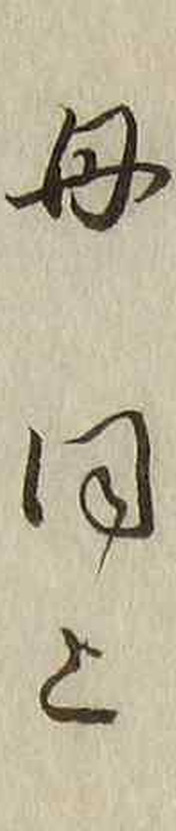母同上

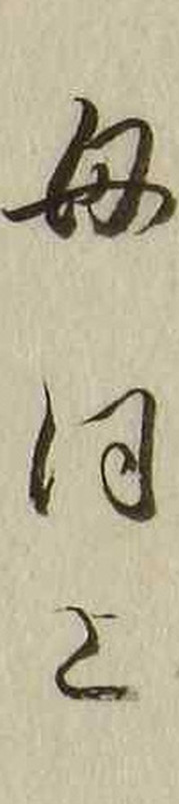母同上
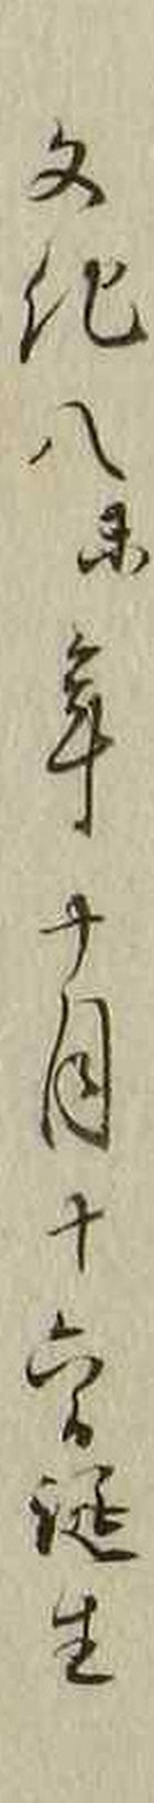文化八未年十月十六日誕生
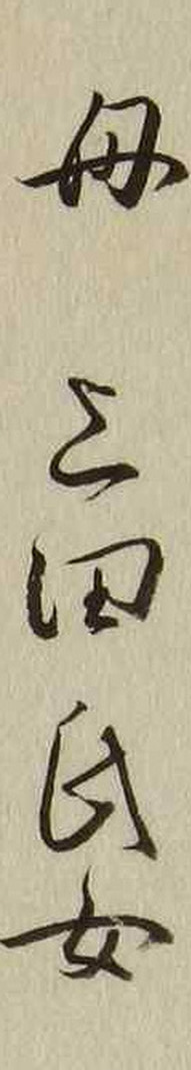母上田氏女
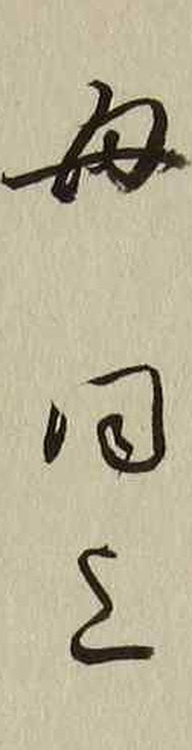母同上
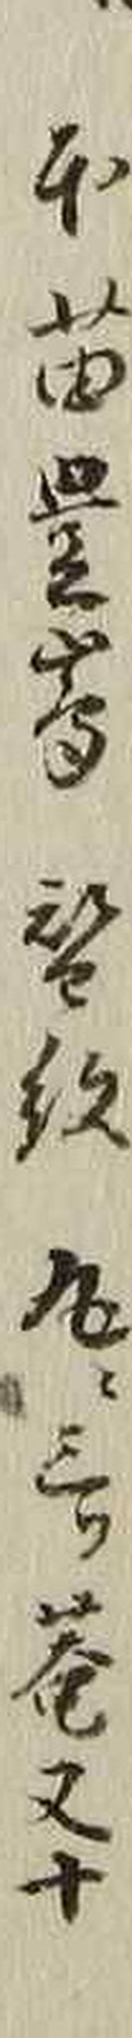本苗豊嶋替紋丸ニ三ツ菴又十
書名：諸士系譜　巻之4　い之部4
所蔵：会津若松市立会津図書館
